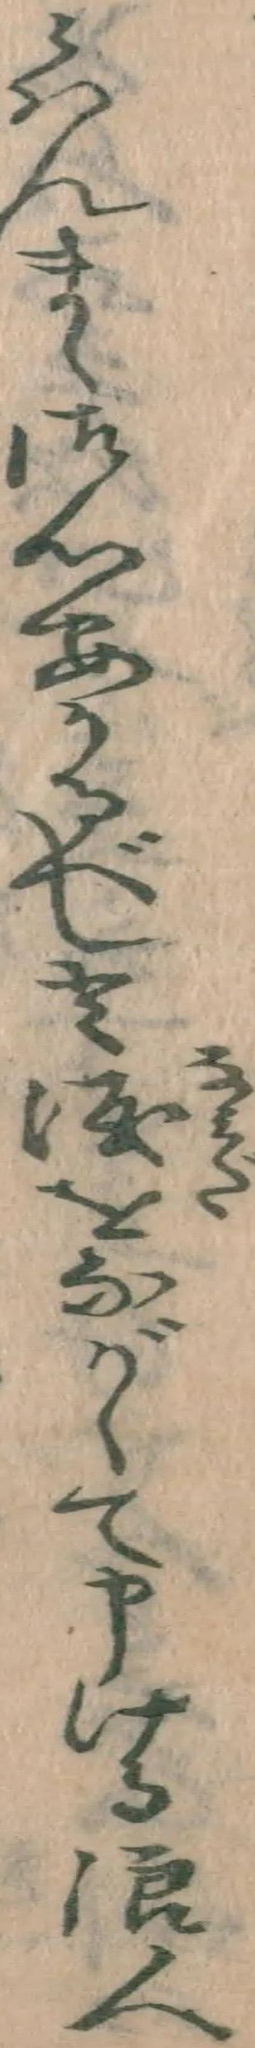候はんまゝ御心安かるべしと涙をながして申ける浪人
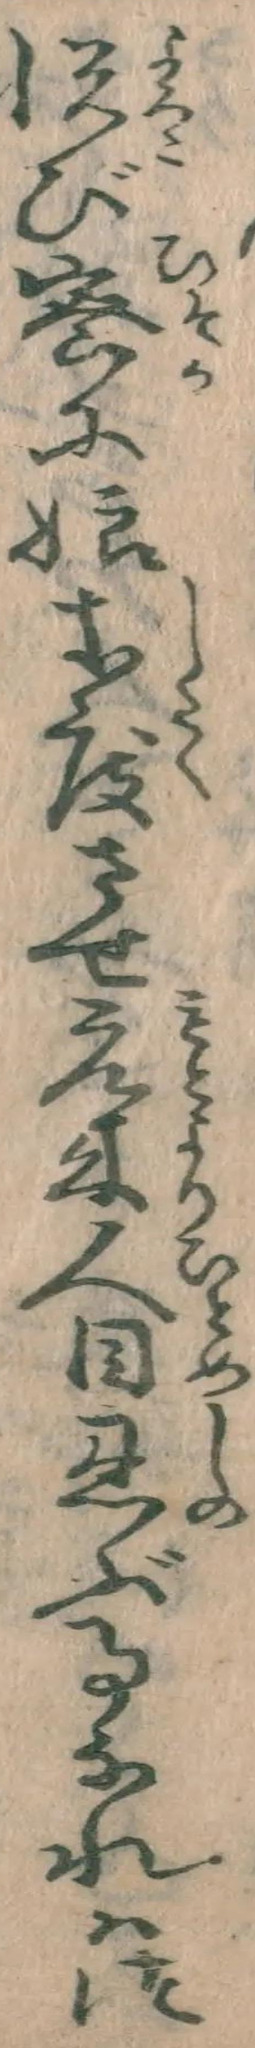悦び密に娘支度させ元来人目忍ぶ事なれはつ
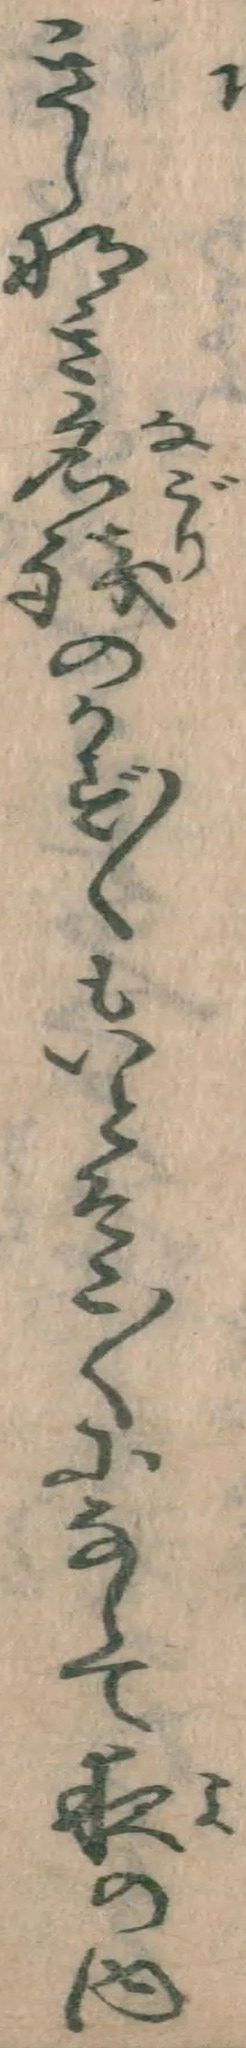きしなき名残のかず〳〵もいとそこ〳〵になして夜の内
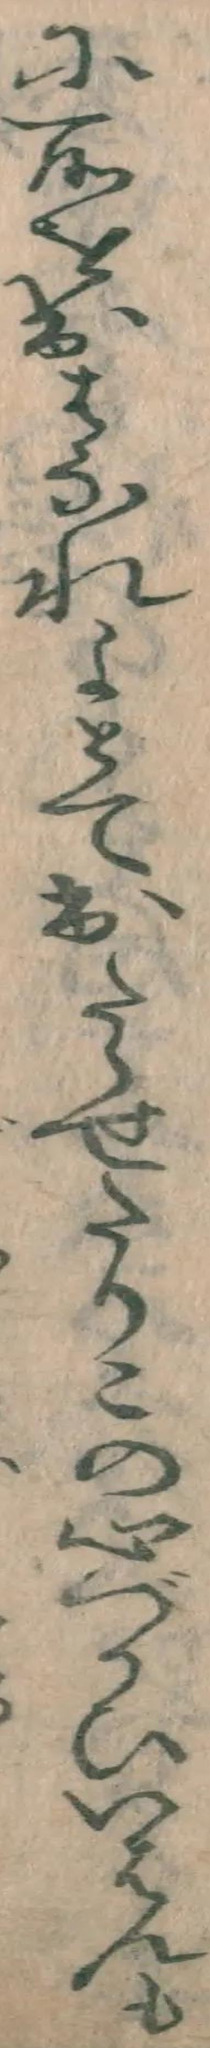に所を出はなれよとて出たゝせたりこの心づかひいはんも
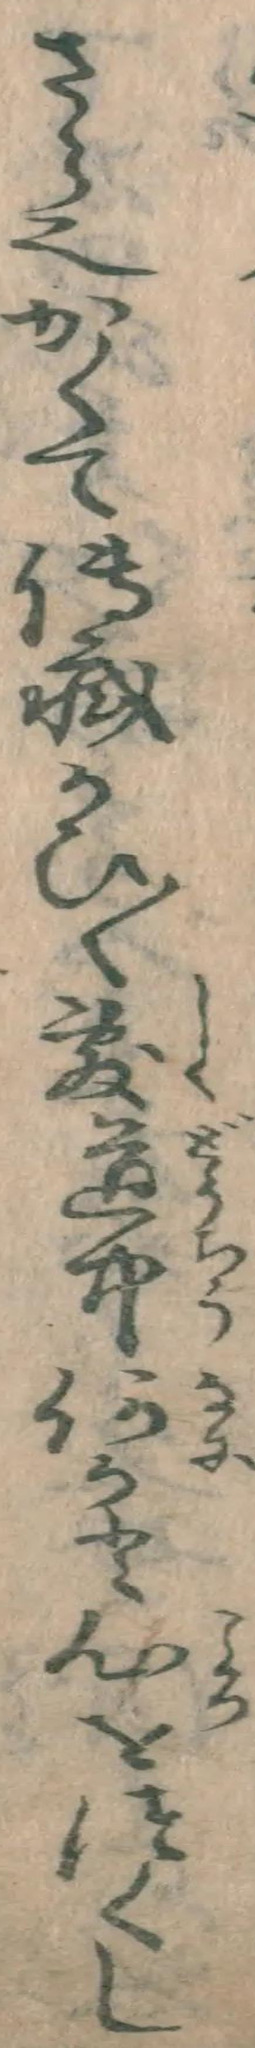さら也かくて伝蔵かひ〳〵敷道中何かと心をつくし
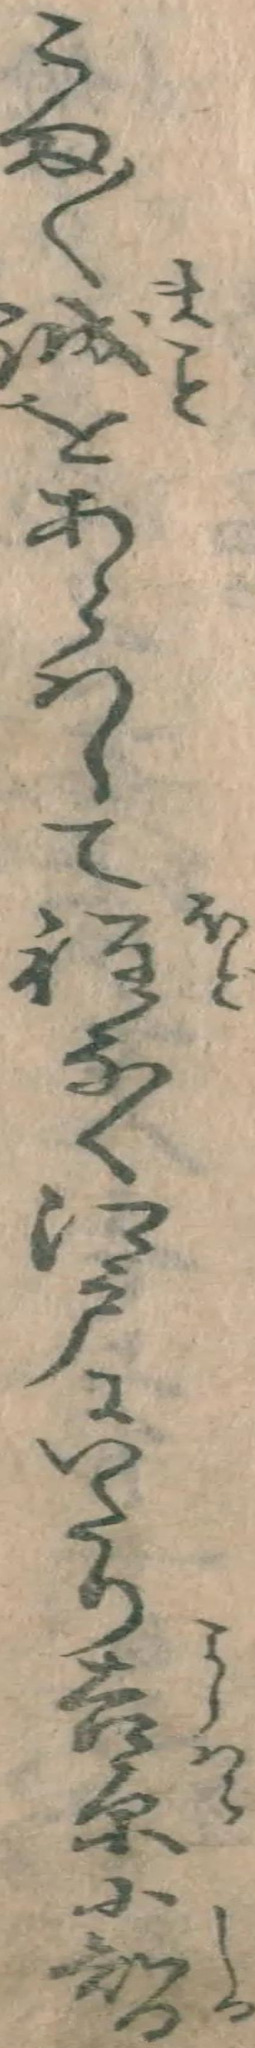こま〳〵誠をあらはして程なく江戸にいたり吉原に知る
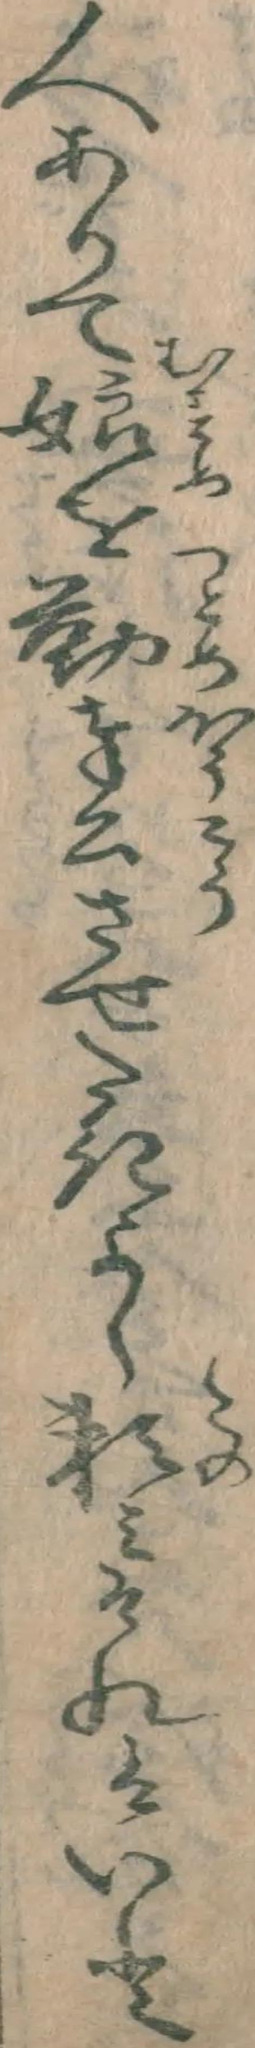人ありて娘を勤奉公させたきよし頼みそれはいと

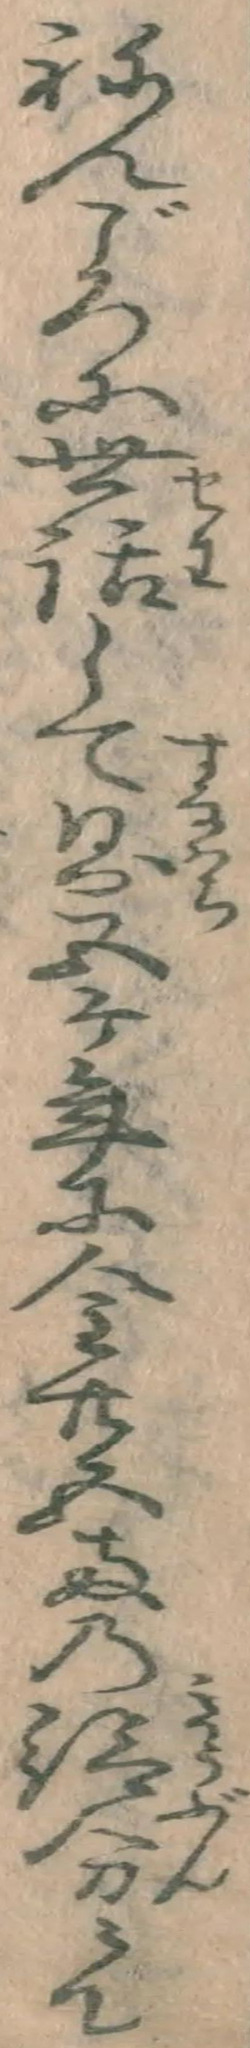ねんごろに世話して則五ケ年に金廿五両の給分にて
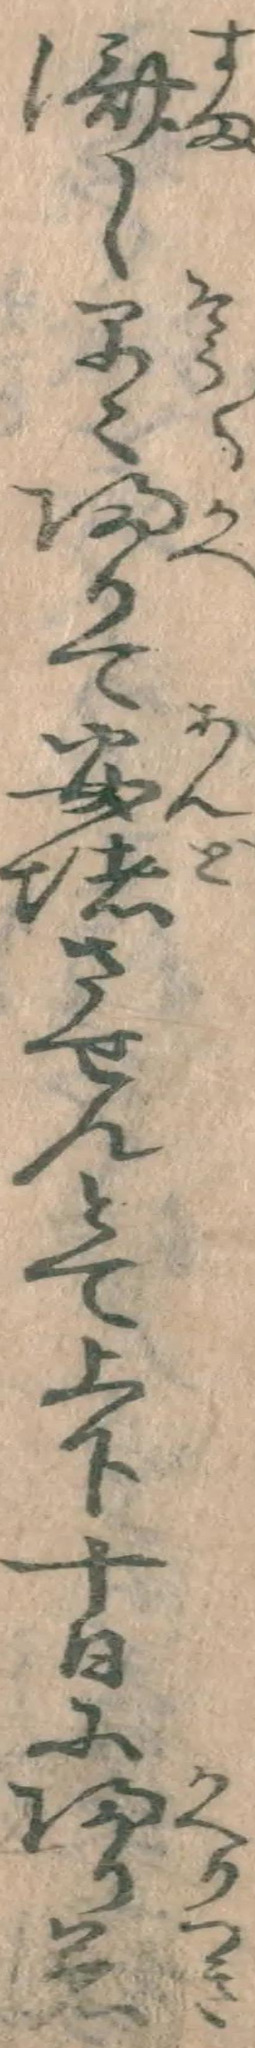済し早々帰りて安堵させんとて上下十日に帰り着
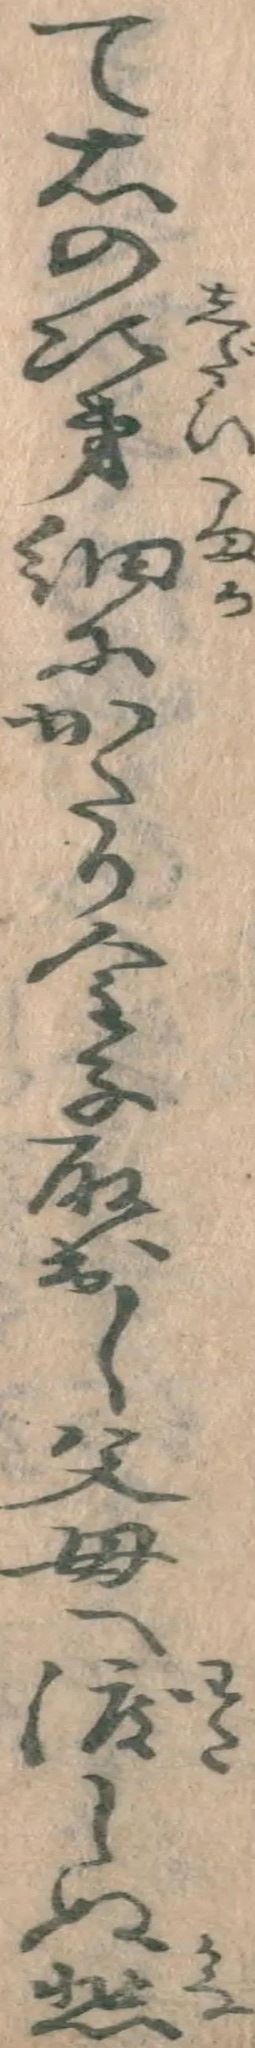て右の次第細にかたり金子取出し父母へ渡しぬ悲
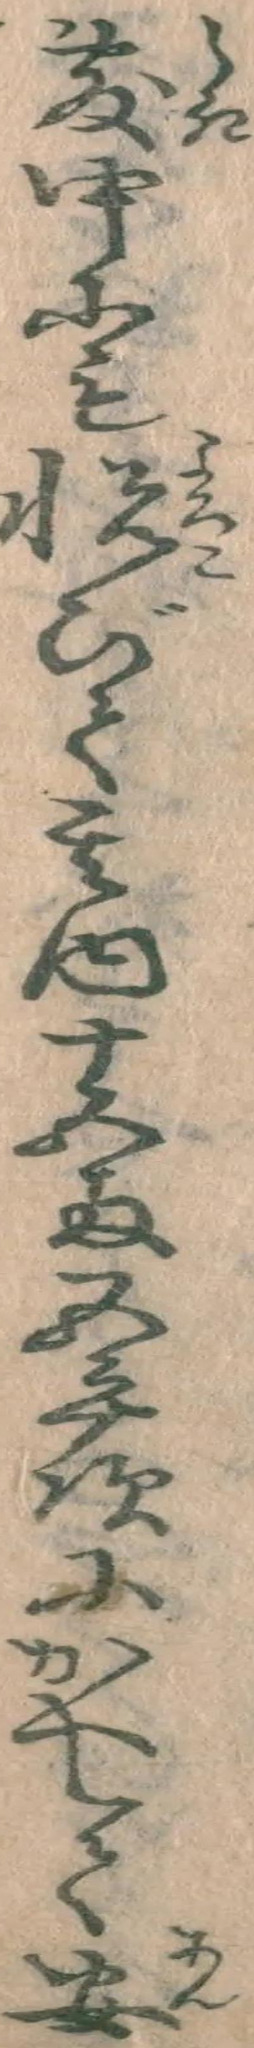敷中にも悦びて其内十五両五平次にかへして安
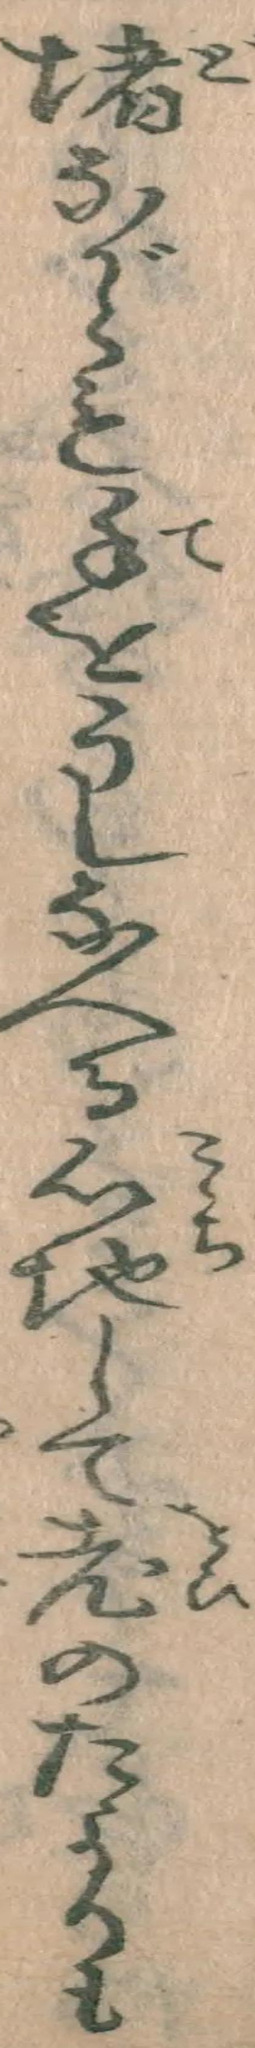堵ながらも手をうしなへる心地して老のたよりも
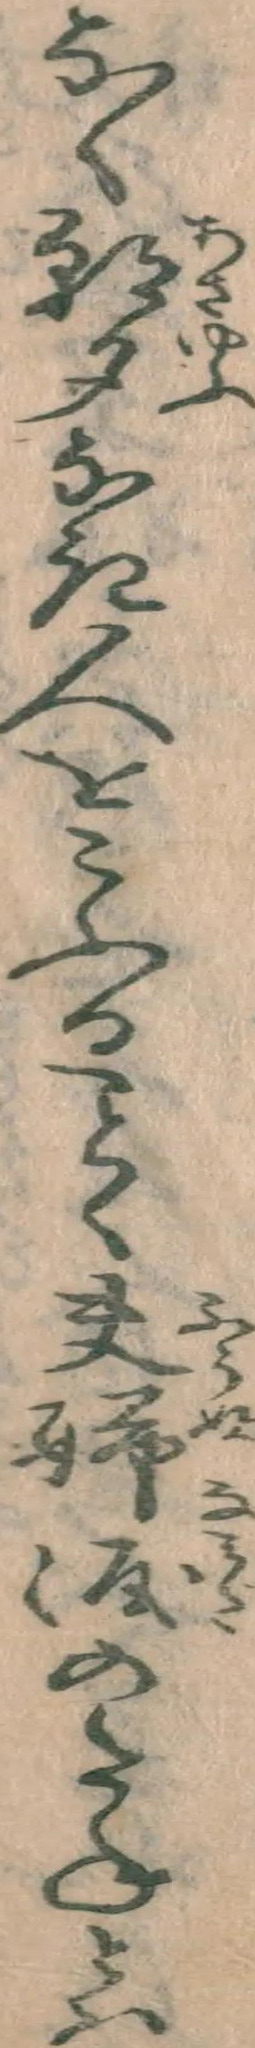なく朝夕なき人をこふることく夫婦涙のたねとは
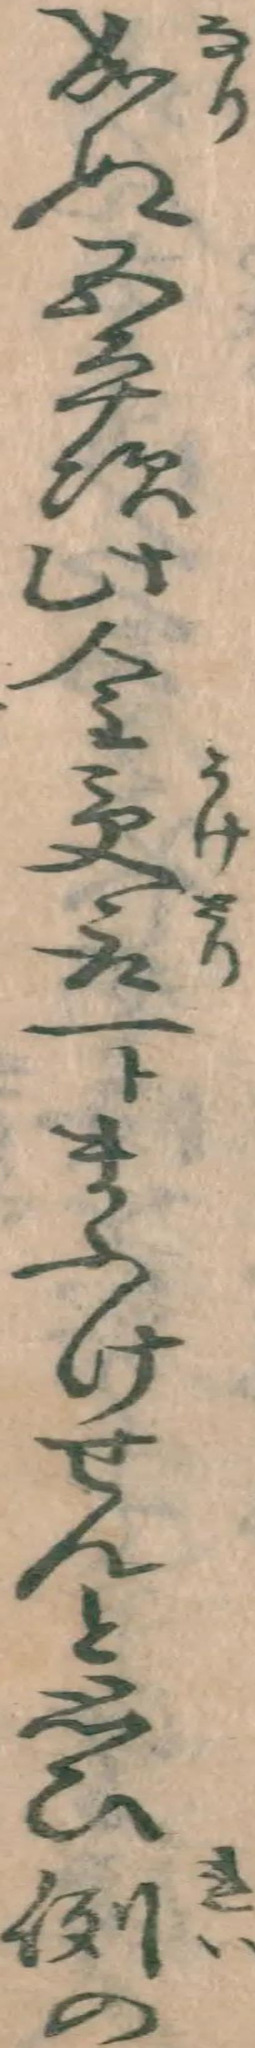成ぬ五平次此金受取一まふけせんと思ひ例の
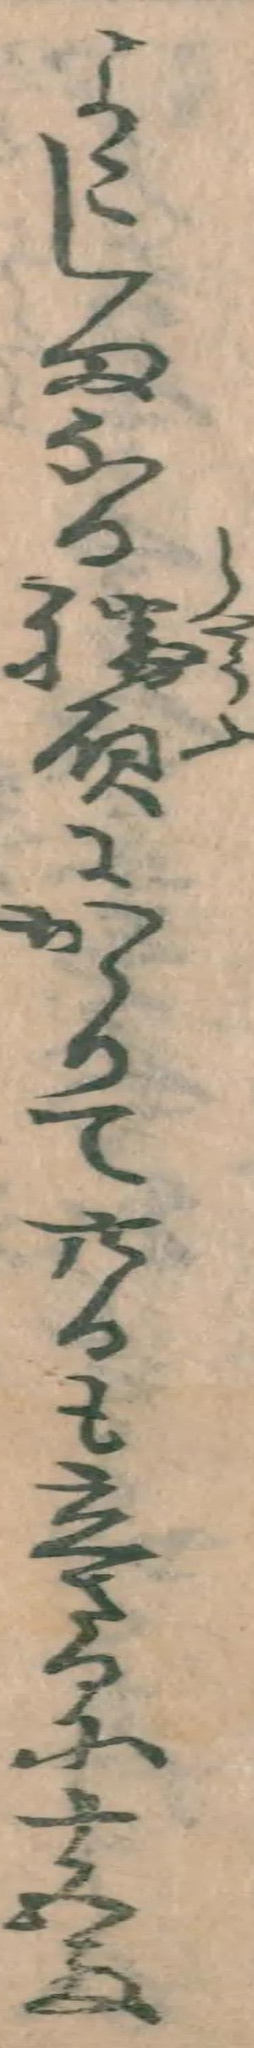よこしまなる勝負にかゝりて廿日も立さるに十五両
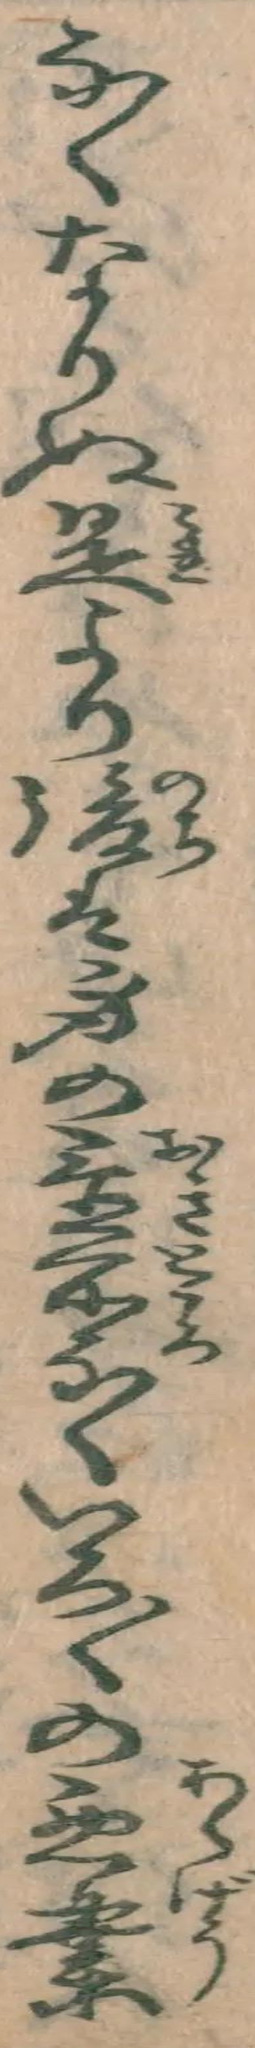なくなりぬ是より後は身の置所なくいろ〳〵の悪業
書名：怪談御伽童 5巻. [2]
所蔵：国立国会図書館 National Diet Library, JAPAN
